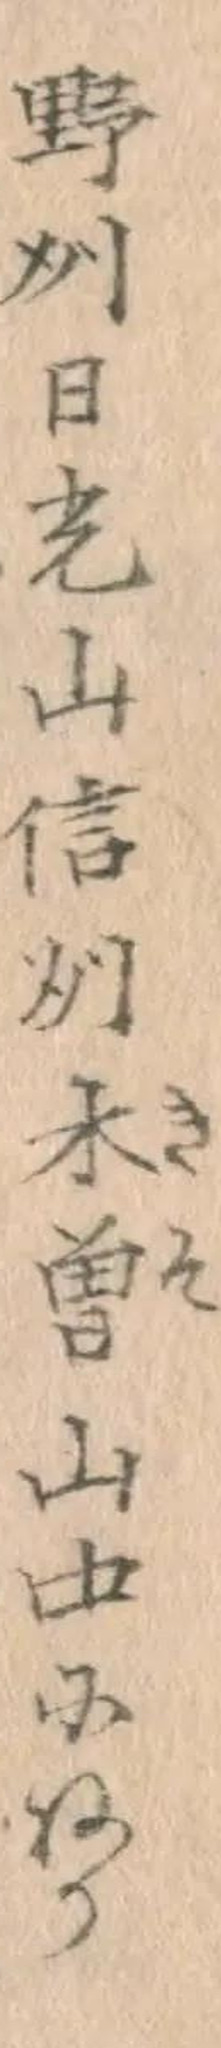野州日光山信州木曽山中にあり
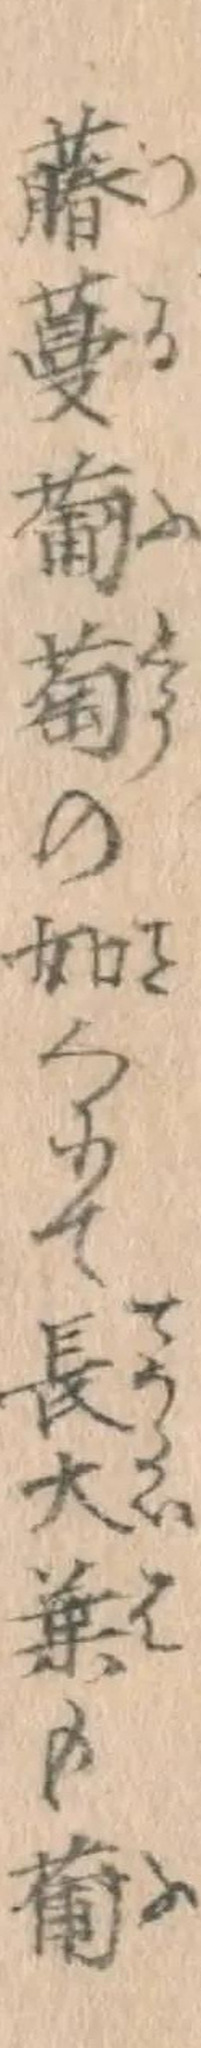藤蔓葡萄の如くにて長大葉も葡
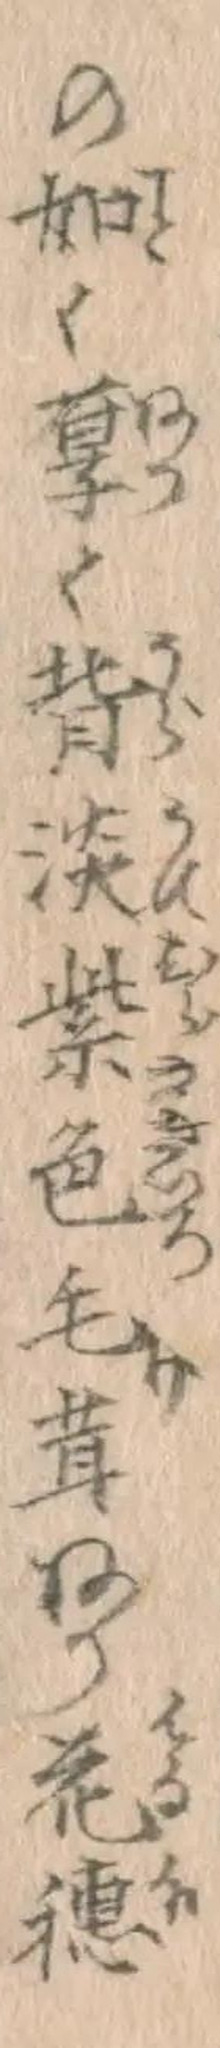の如く厚く背淡紫色毛茸あり花穂
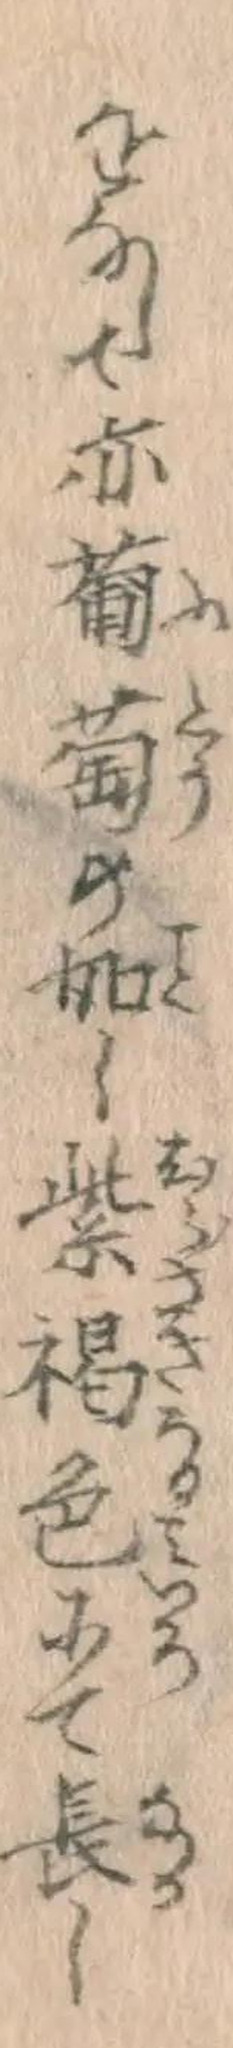をなして亦葡萄の如し紫褐色にて長し

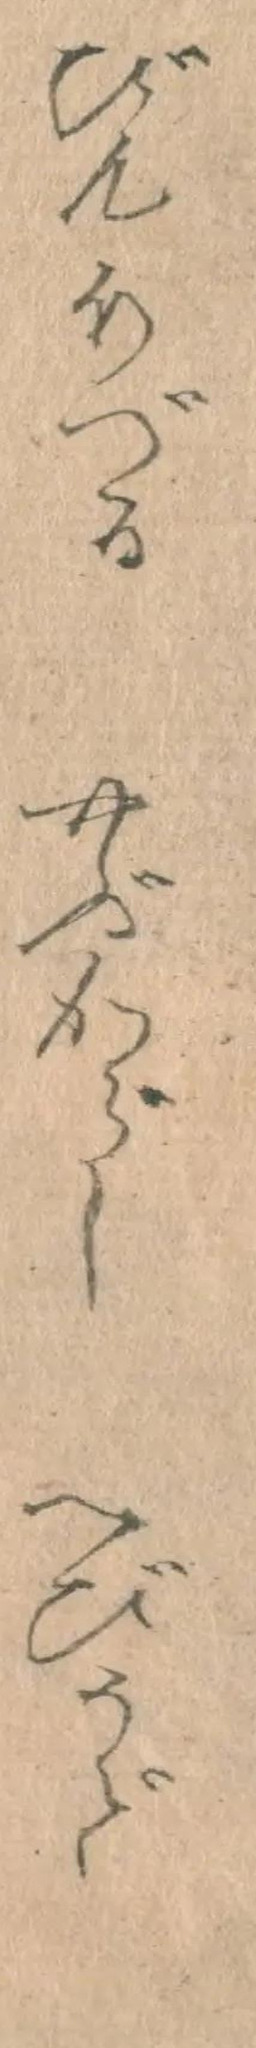びんほづるやぶからしへびうど
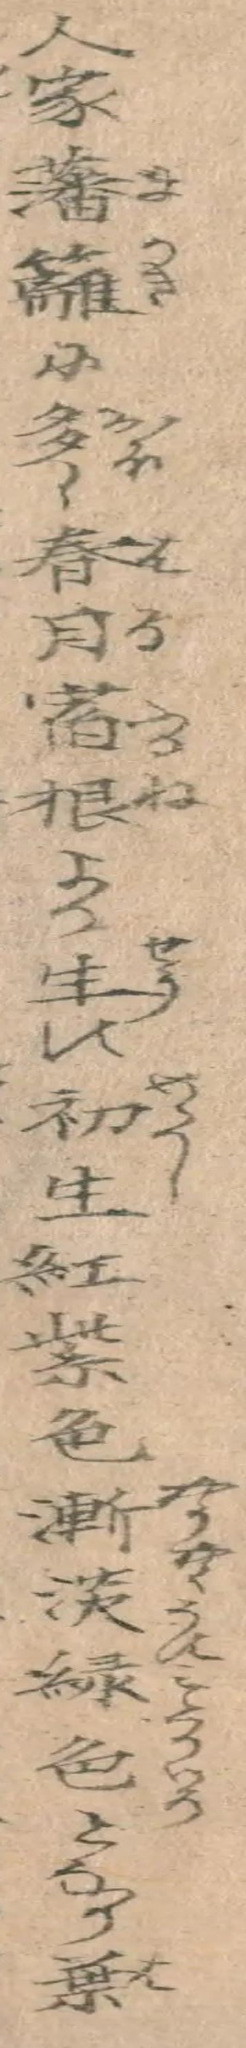人家藩籬に多し春月宿根より生す初生紅紫色漸淡緑色となり葉
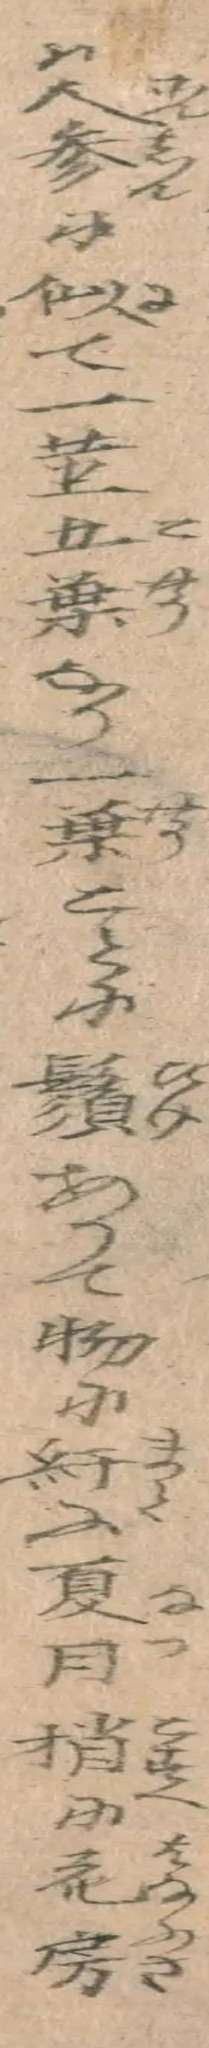は人参に似て一茎五葉なり一葉ことに鬚ありて物に紆ふ夏月梢に花房
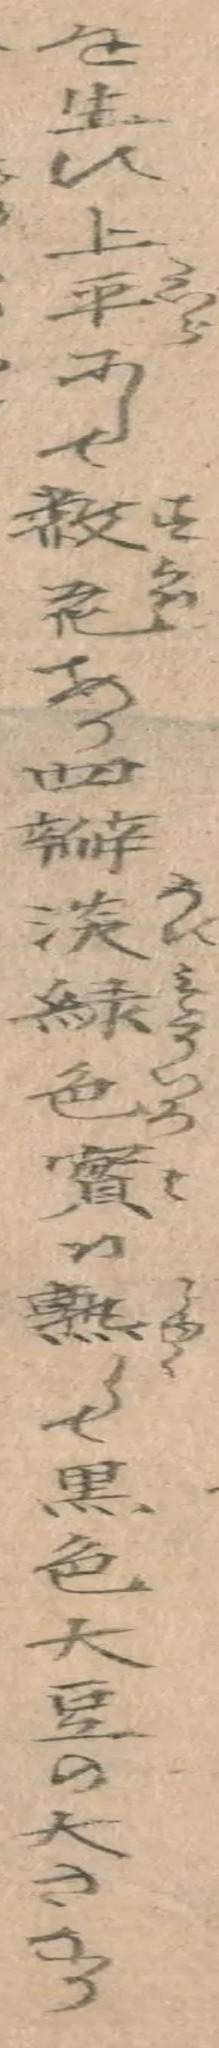を生す上平にして数花あり四弁淡緑色実は熟して黒色大豆の大さなり
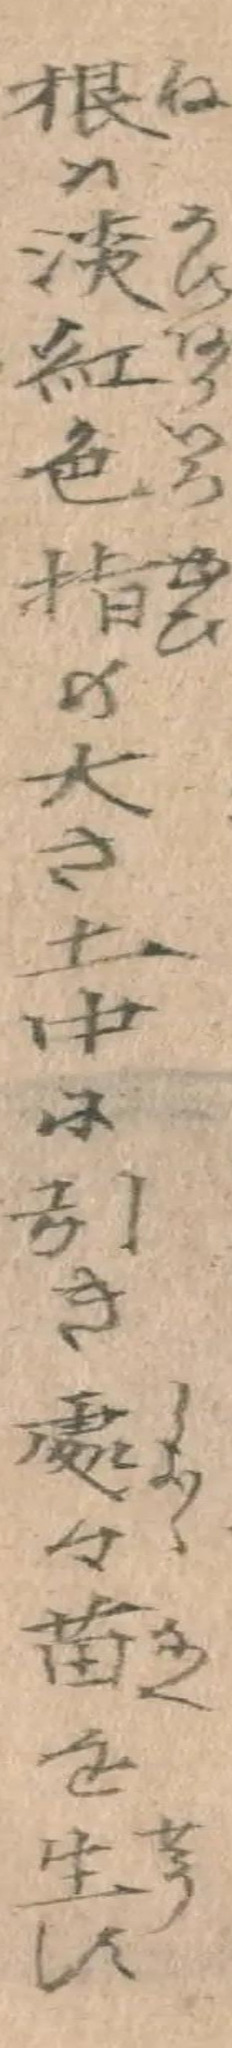根は淡紅色指の大さ土中に引き処々苗を生す

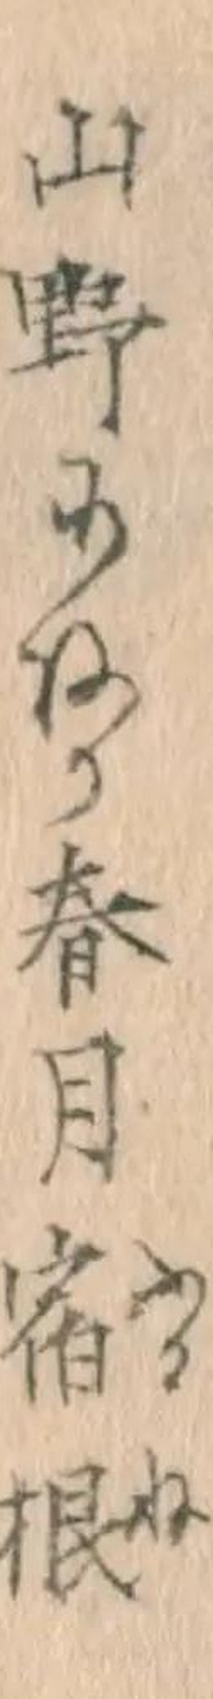山野にあり春月宿根
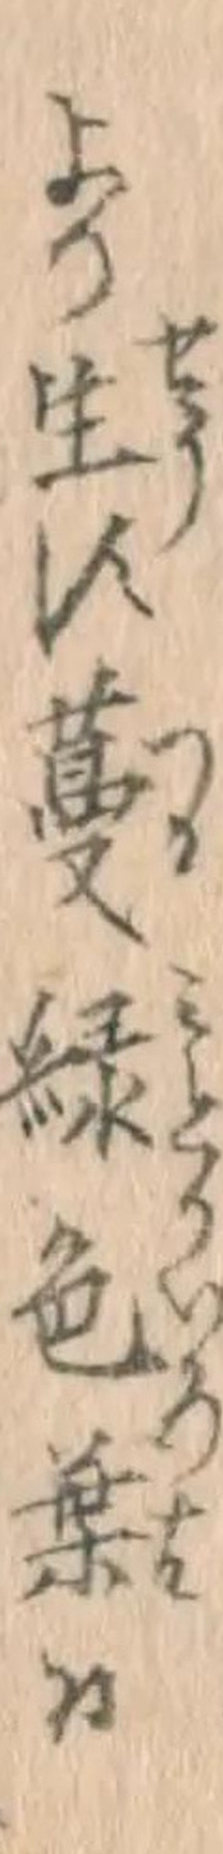より生す蔓緑色葉は
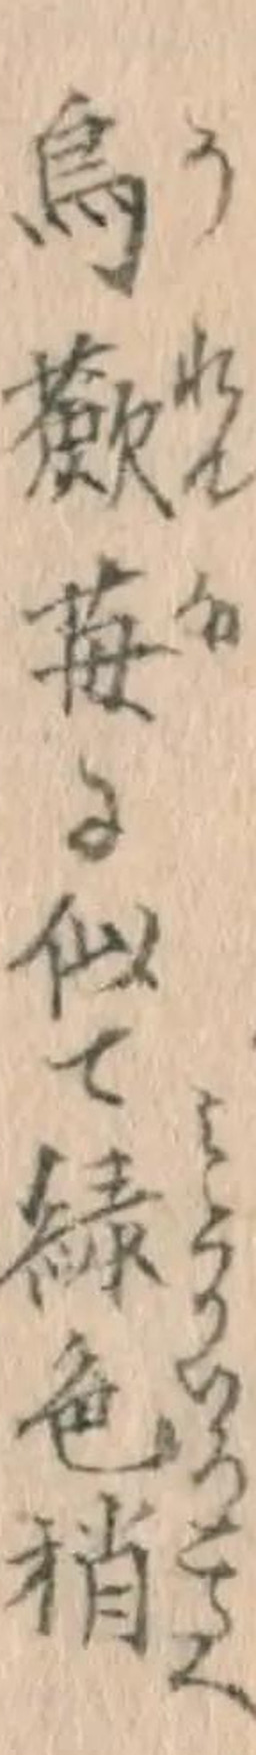烏蘞苺に似て緑色梢
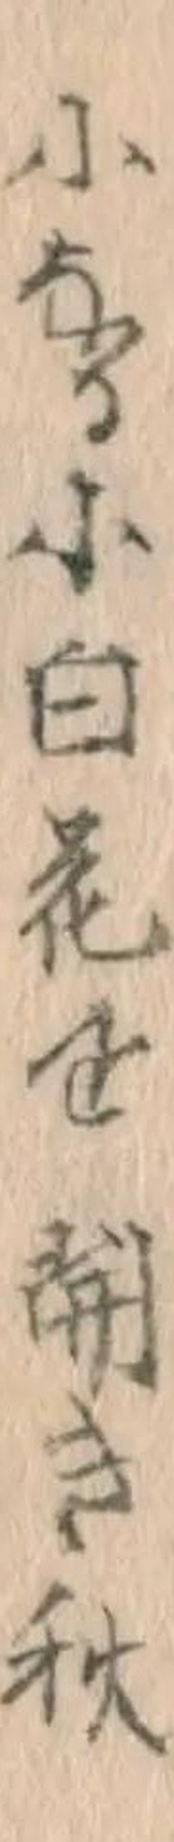小なる小白花を開き秋
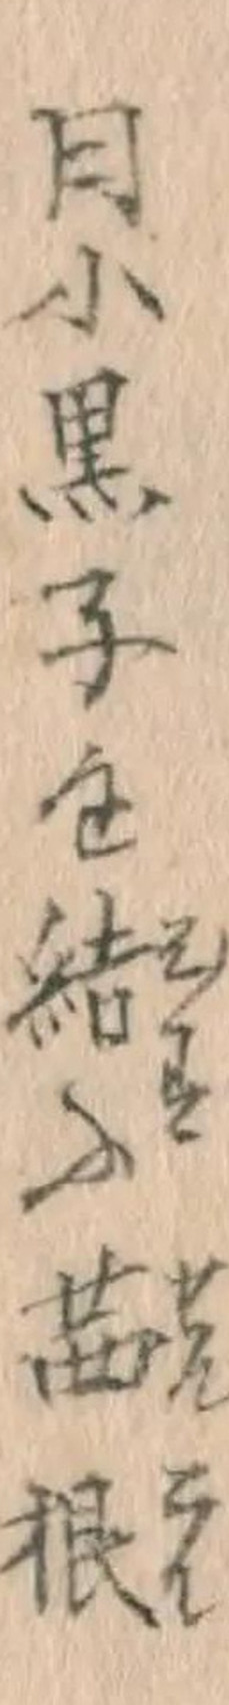月小黒子を結ふ茜根
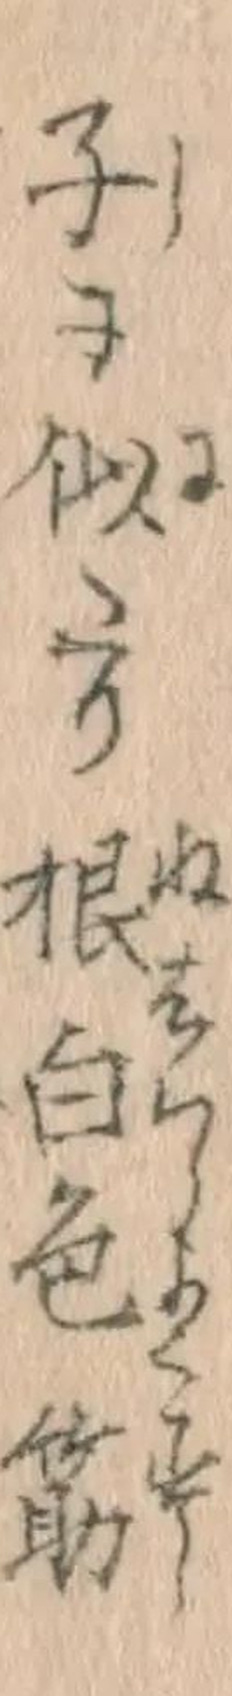子に似たり根白色筋
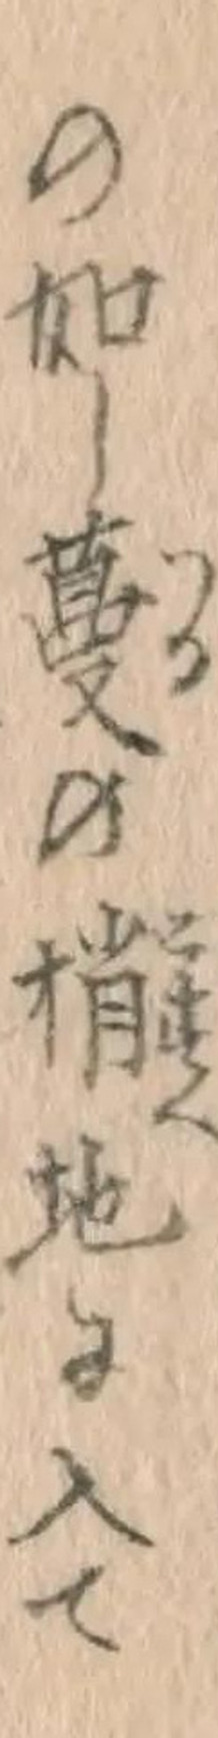の如し蔓の梢地に入て
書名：本草図譜. 巻31-33
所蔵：国立国会図書館 National Diet Library, JAPAN
